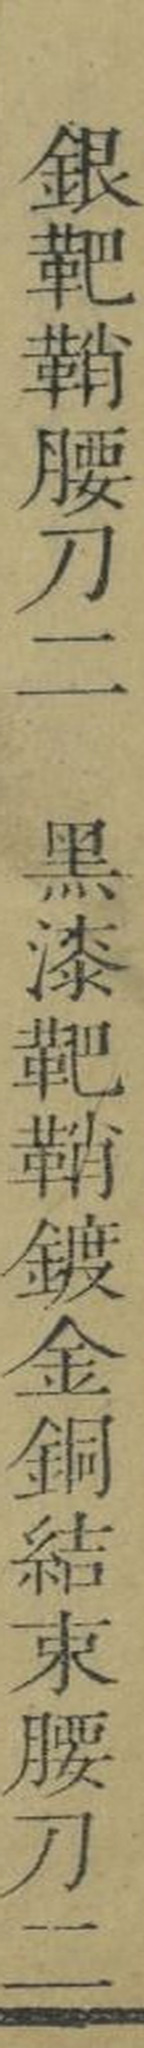銀靶鞘腰刀二黑漆靶鞘鍍金銅結束腰刀二
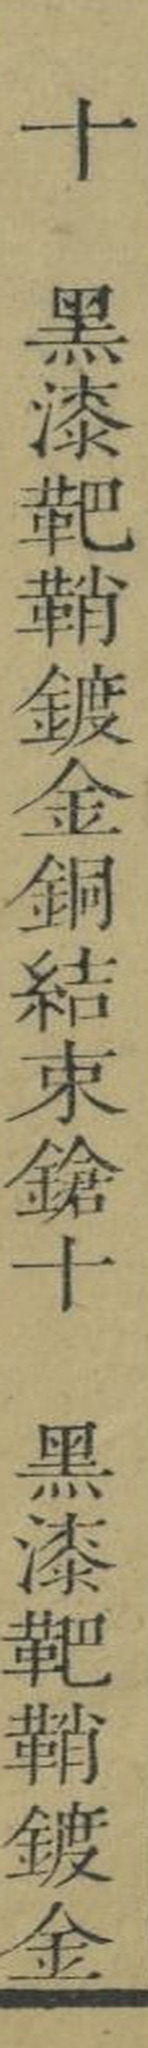十黑漆靶鞘鍍金銅結束鎗十黑漆靶鞘鍍金
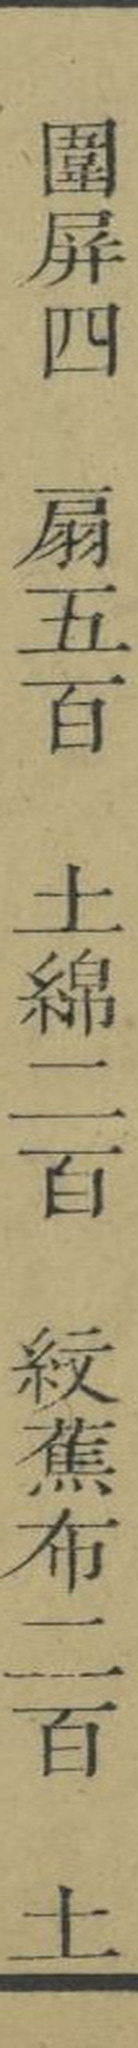圍屏四扇五百土綿二百紋蕉布二百土
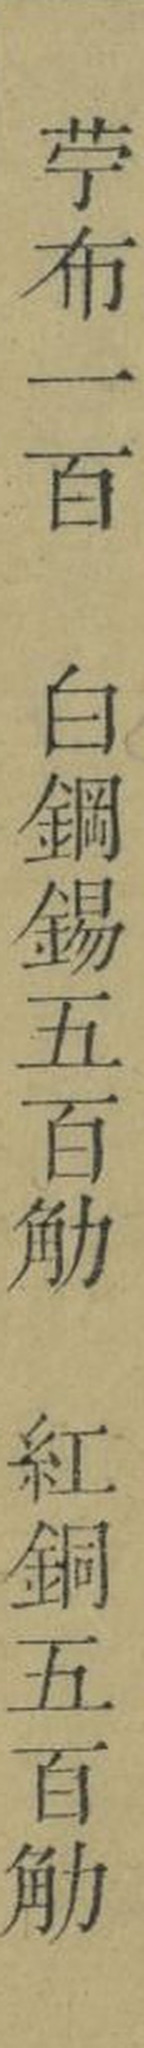苧布一百白鋼錫五百觔紅銅五百觔
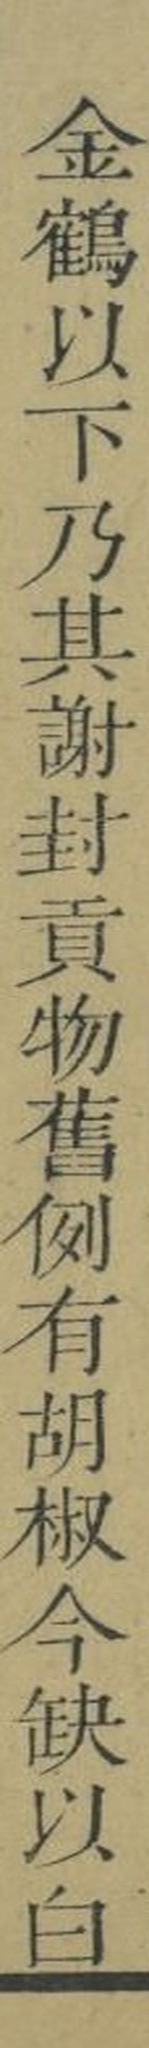金鶴以下乃其謝封貢物舊例有胡椒今缺以
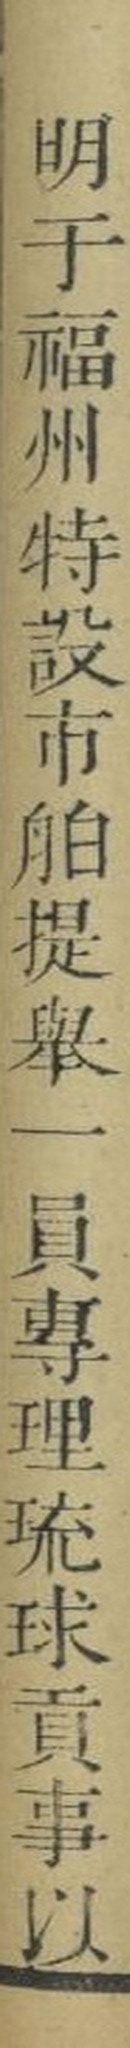明于福州特設市舶提舉一員專理琉球貢事以
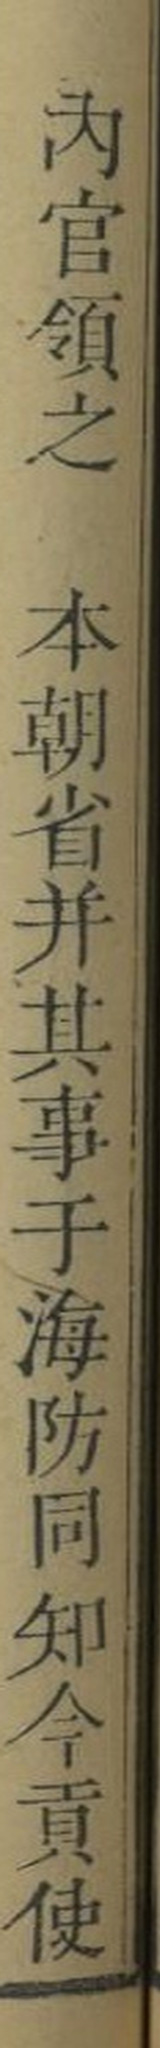内官領之本朝省并其事于海防同知令貢使
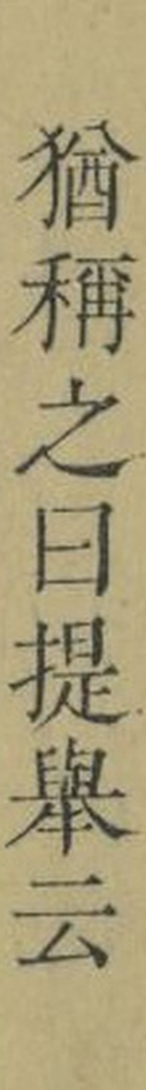猶稱之曰提舉云
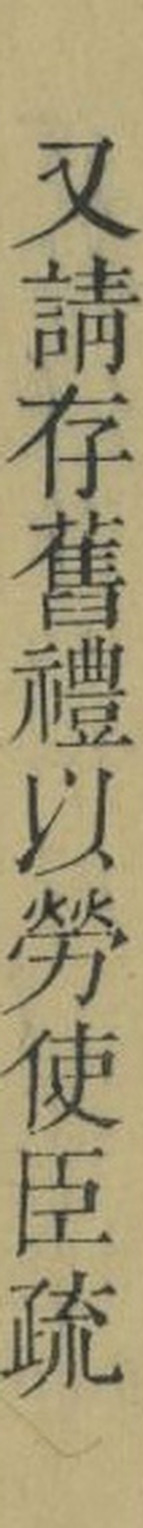又請存舊禮以勞使臣疏
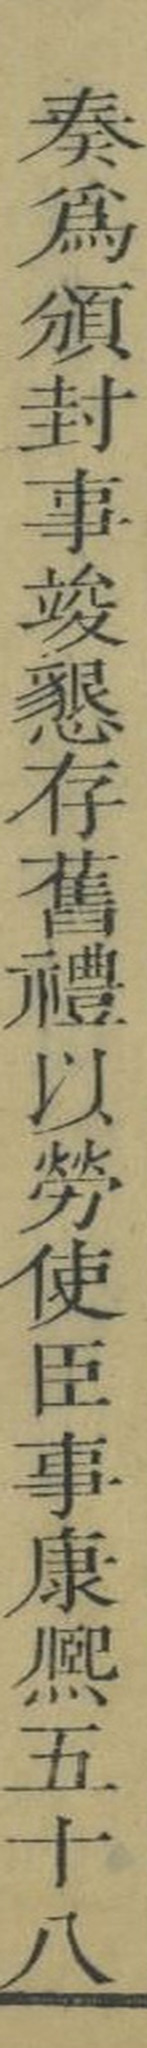奏爲領封事竣懇存舊禮以勞使臣事康熈五十八
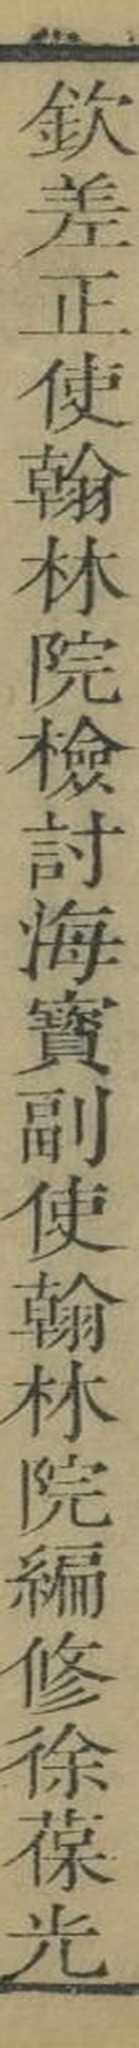欽差正使翰林院檢討海寶副使翰林院編修徐葆光
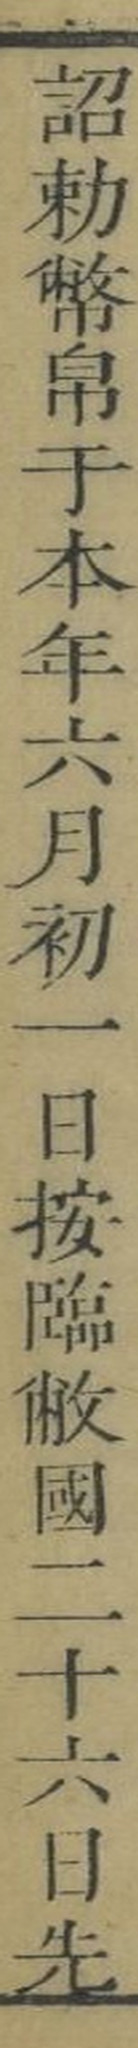詔勅幣帛于本年六月初一日按臨敝國二十六日先

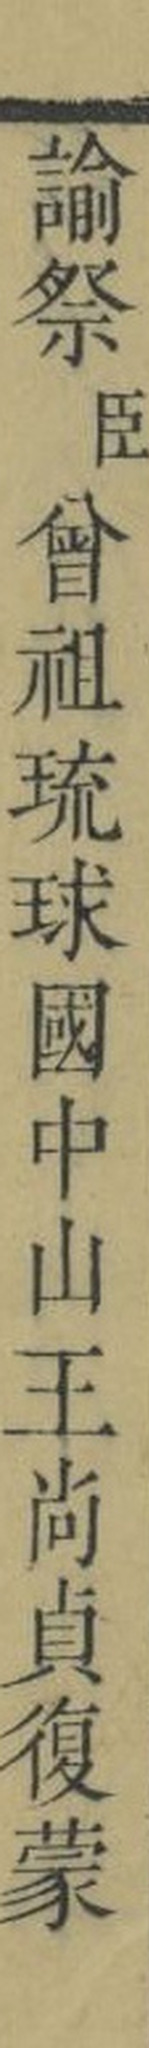諭祭臣曾祖琉球國中山王尚貞復蒙
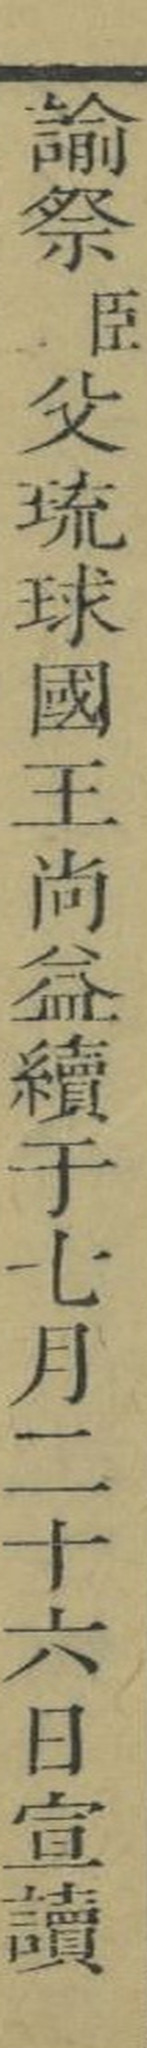諭祭臣父琉球國王尚益續于七月二十六日宣讀
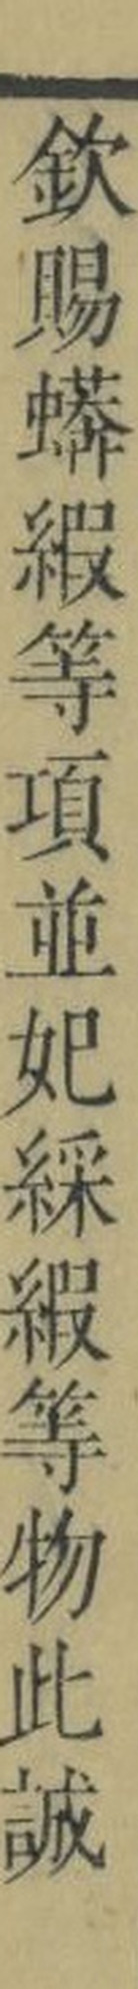欽賜蠎縀等項並妃綵縀等物此誠
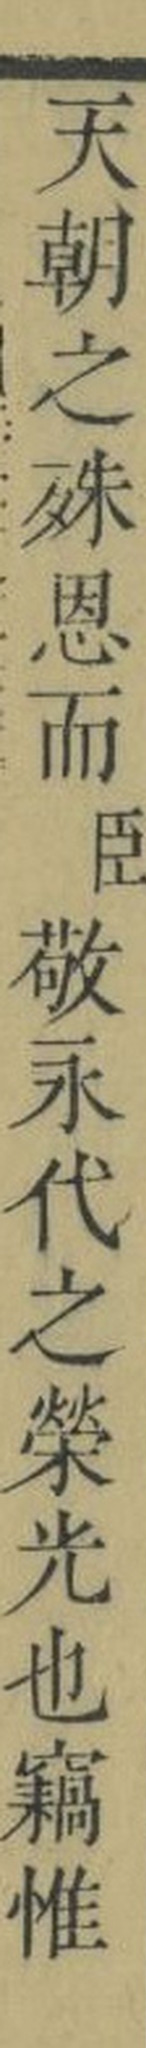天朝之殊恩而臣敬永代之榮光也竊惟
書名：中山伝信録 巻二
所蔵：University of the Ryukyus Library
